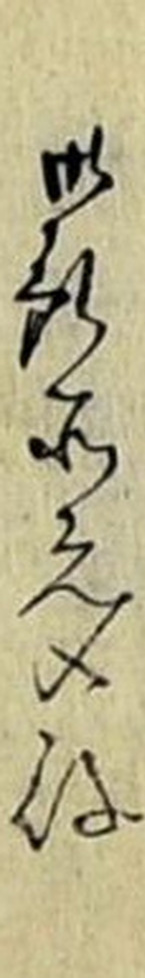御預所元〆役
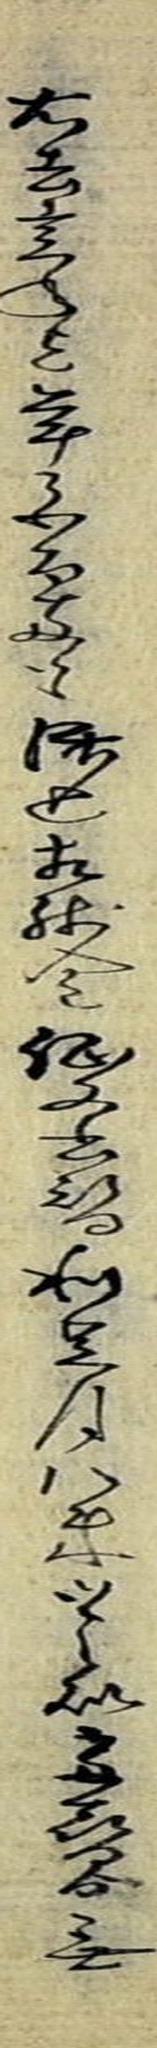右去亥年迄年々五百両つヽ済返相残金証文書替利足月八朱つヽ之処当暮ゟ無
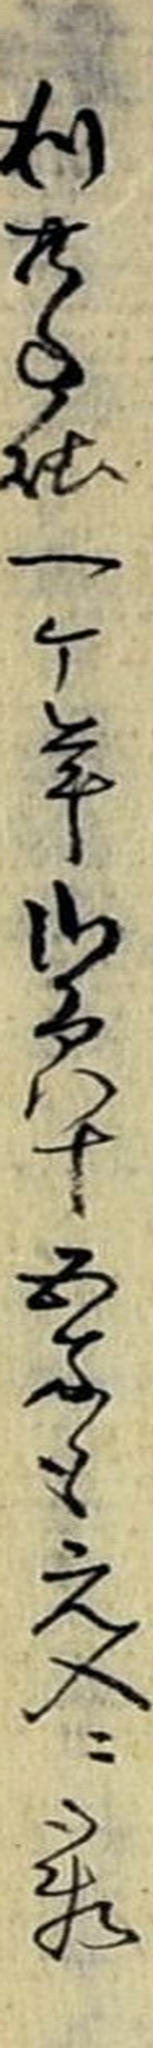利廿年賦一ヶ年弐百八十五両つヽ元入に御頼
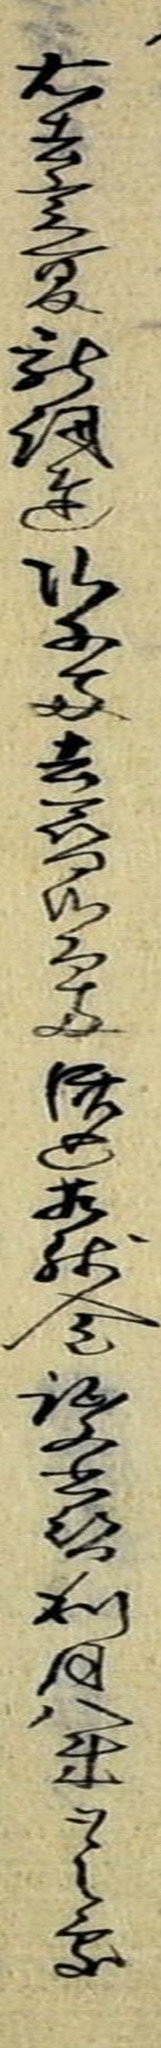右去亥夏新調弐千両去暮弐百両済返相残金証文書替利月八朱つヽ之処
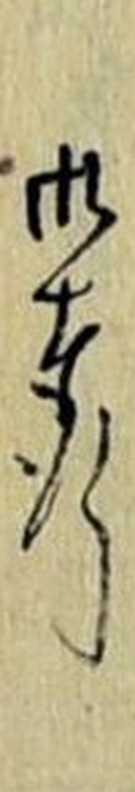御奉行
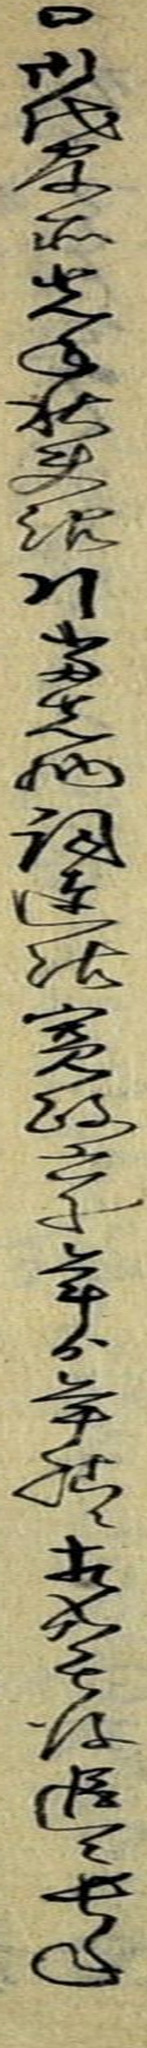○御代官所先年秋夫銀引当先納調達銀寛政六寅年ゟ年賦に相成其後追々長年
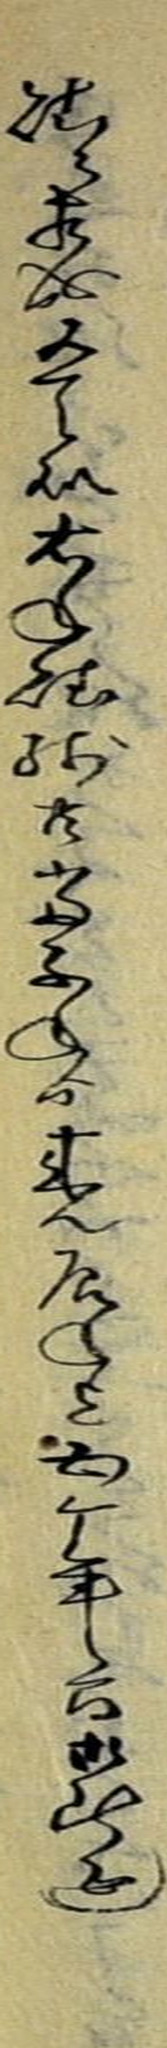賦に相成有之候処右年賦残共当子年ゟ来ル辰年迄五ヶ年之間御断延
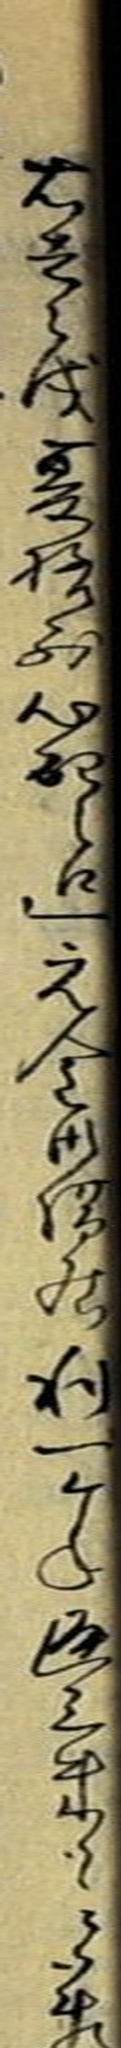右去々戌夏格別心配之口」元金御借居利一ヶ年通三朱つヽに御頼
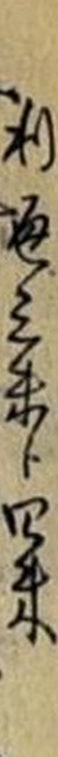利通三朱ト四朱
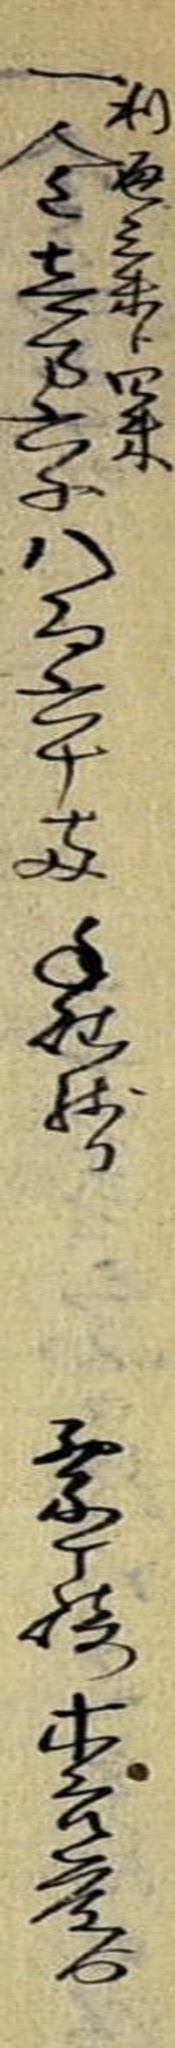一金壱万六千八百六十両年賦残り栗ヶ崎
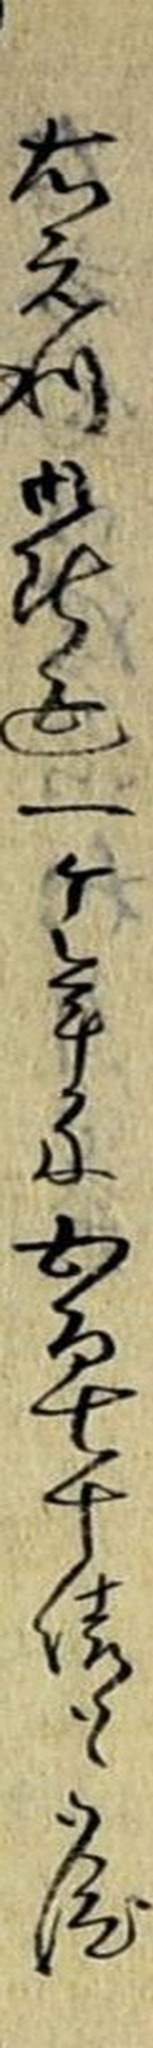右元利御断延一ヶ年米五百七十俵つヽ御渡
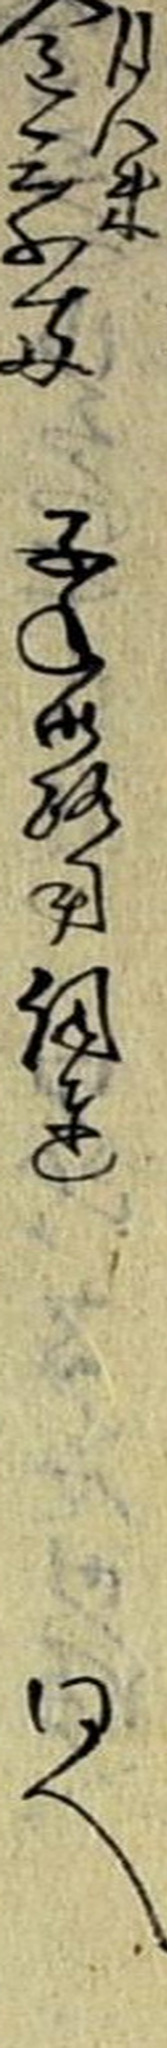一金三千両子年御路用調達同人
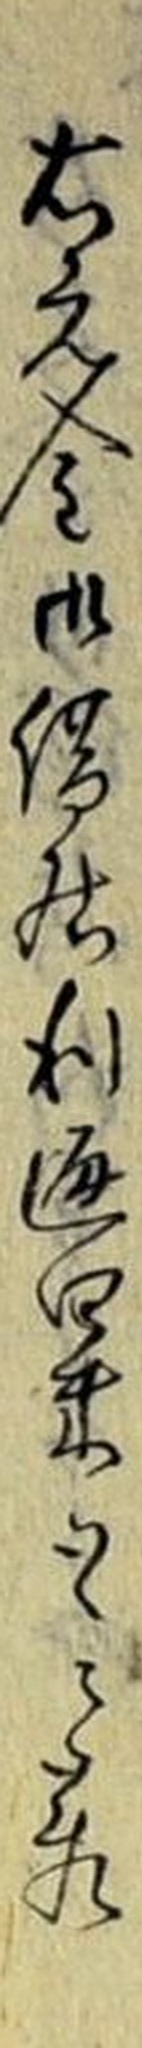右元金御借居利通四朱つヽに御頼
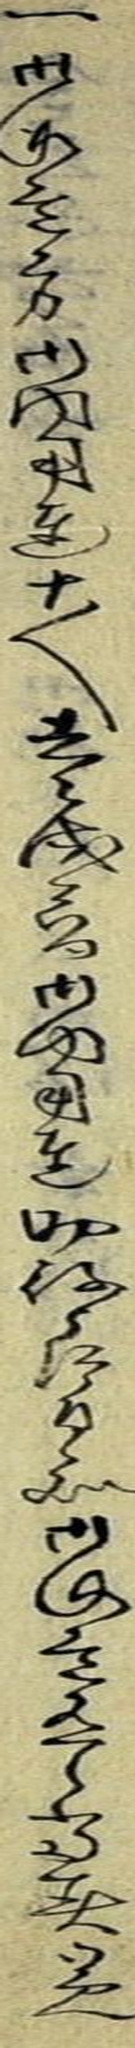一御趣意方御内用達十人去々戌暮御内用達助役被仰付候処御趣意有之当春御免
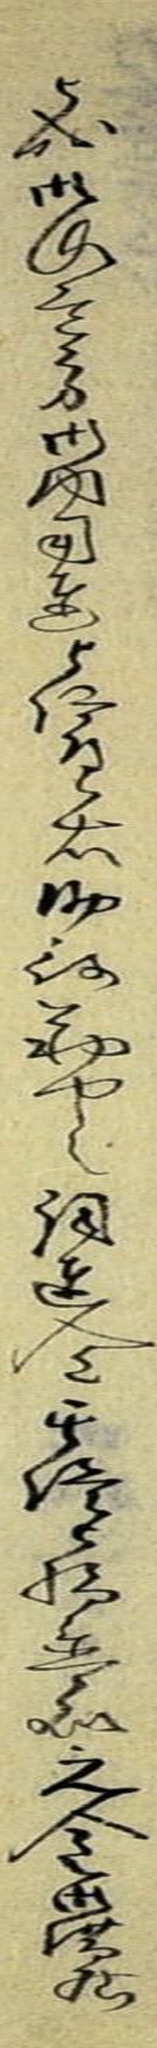被成御趣意方御内用達被仰付候右助役勤中調達金其侭被指置候処元金御借居
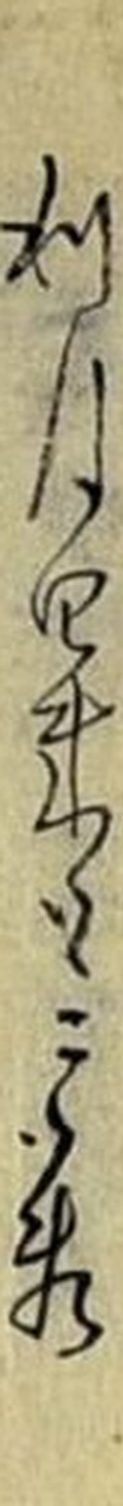利月四朱つヽに御頼
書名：命令之部 四
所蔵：福井県文書館 Fukui Prefectural Archives
